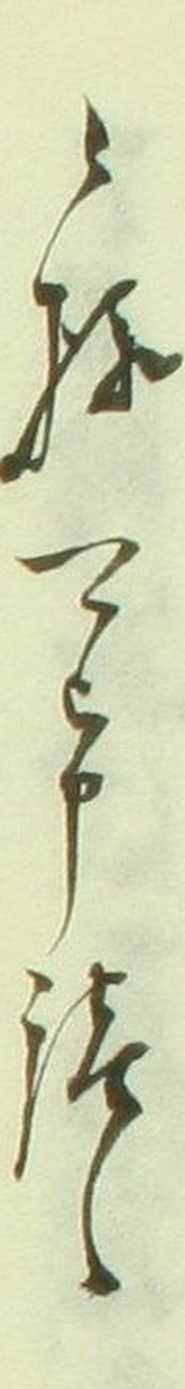候様可被申談候
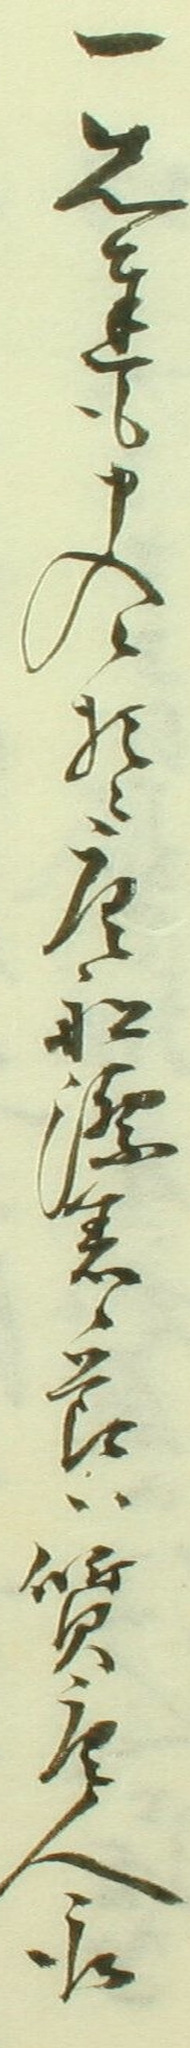一先達も申入候様ニ唐船漂着候節質唐人取
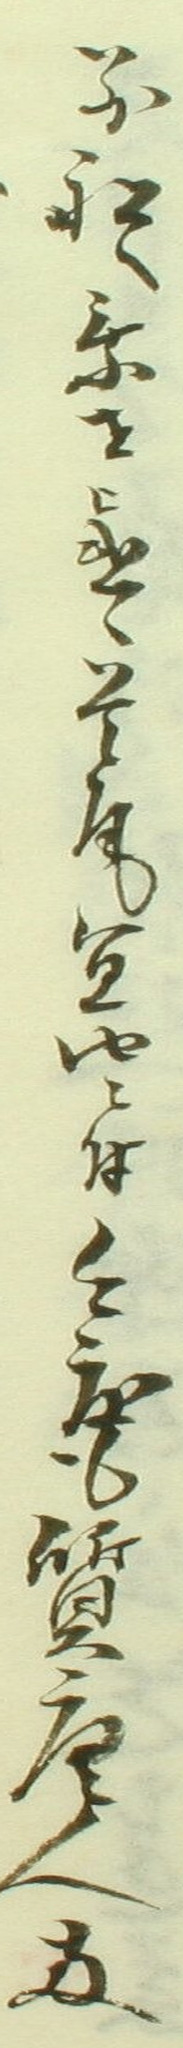別船へ乗せ被遣候首尾宜由ニ付今度も質唐人両
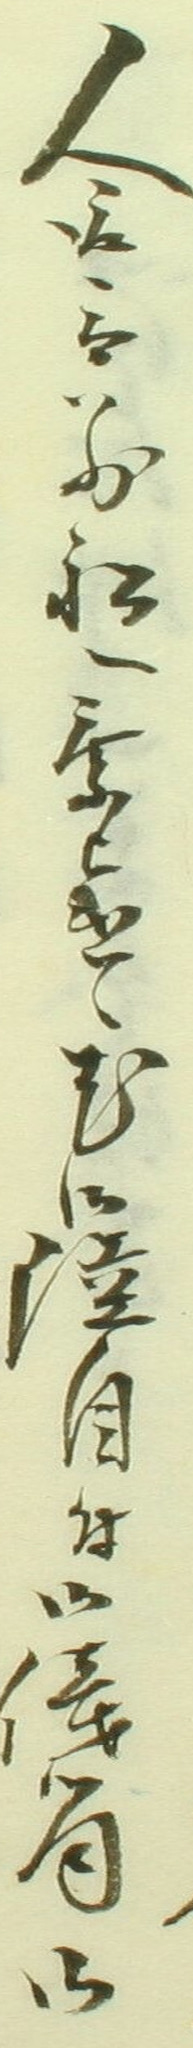人取候而別船へ乗被遣候尤御陸目付御傍御用御
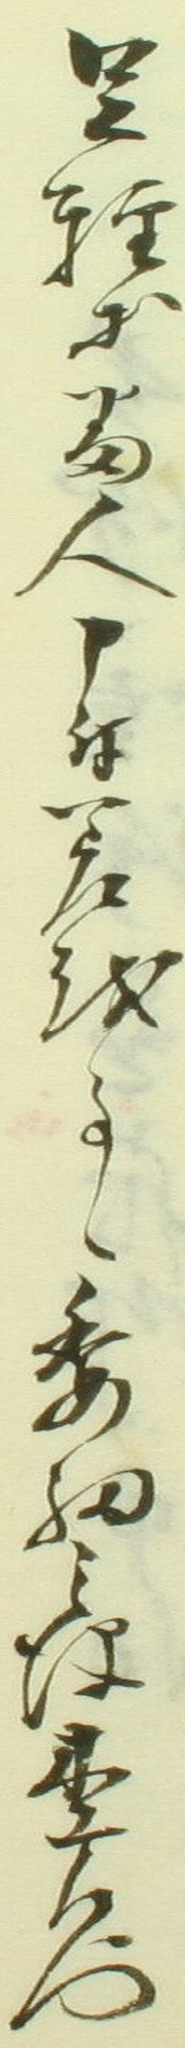足軽等番人申付差越事候委細之儀杢左衛門
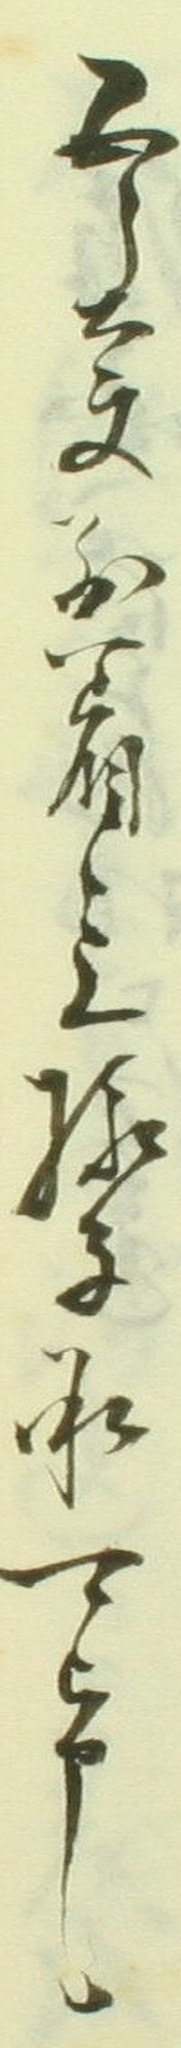五郎太夫別着候上様子承可被申候
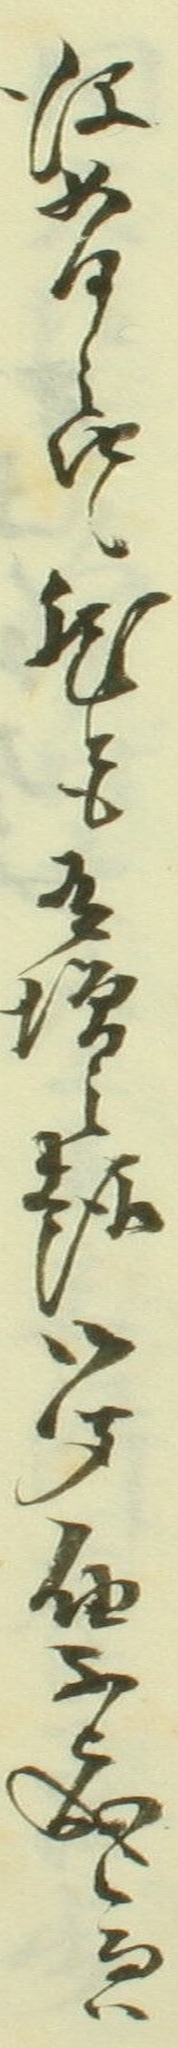儀如何之由候然とも有増趣御聞届不被成候而ハ
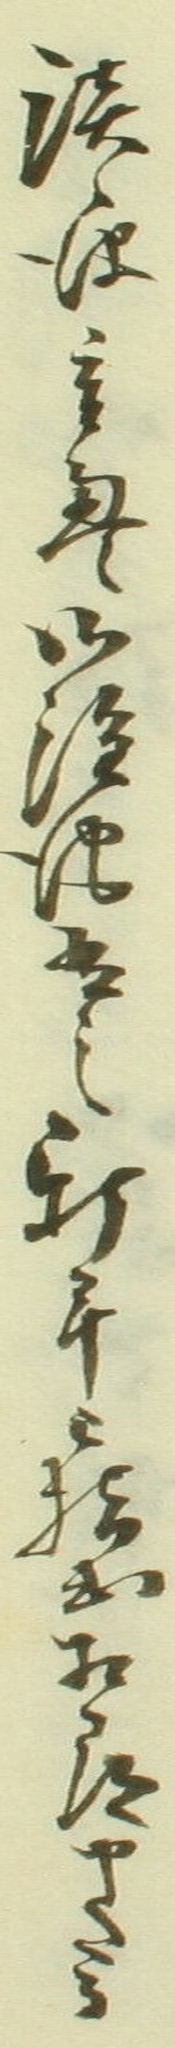談候儀重畳御詮議有之新平被指出相尋申たる
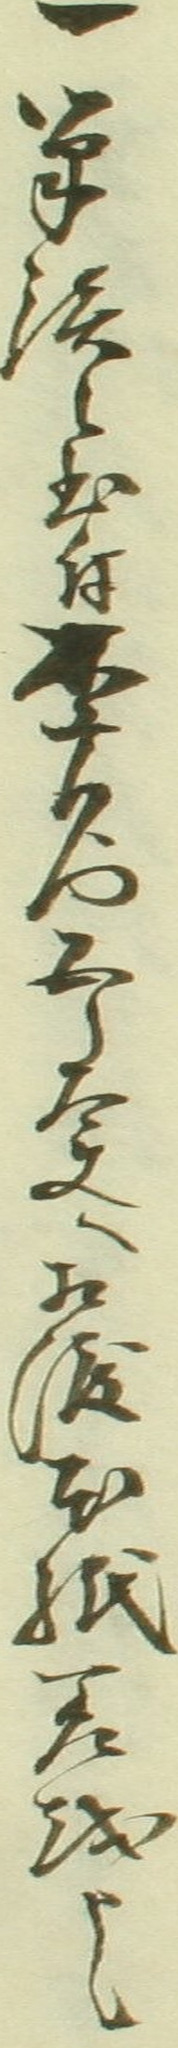一筆談候書付杢左衛門五郎太夫へ相渡本紙差越申候
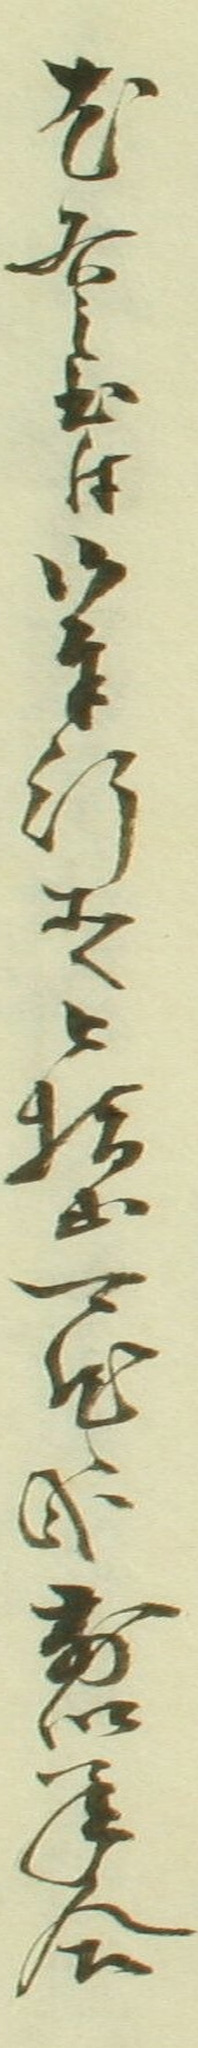尤右之書付御奉行所へ被指出可然哉前以承合
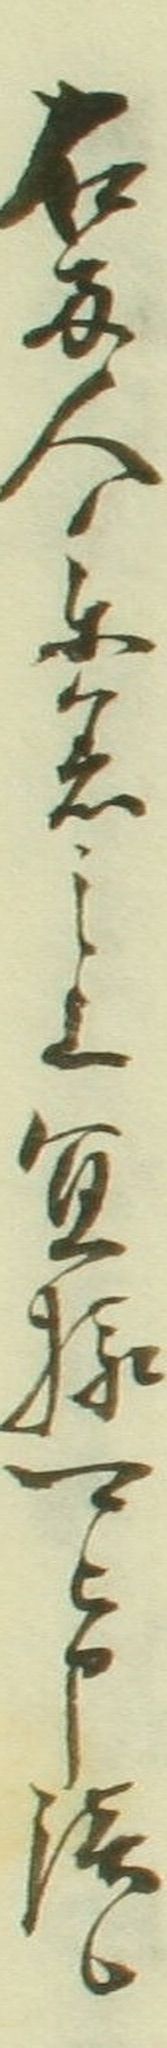右両人参着之上宜様可被申談候
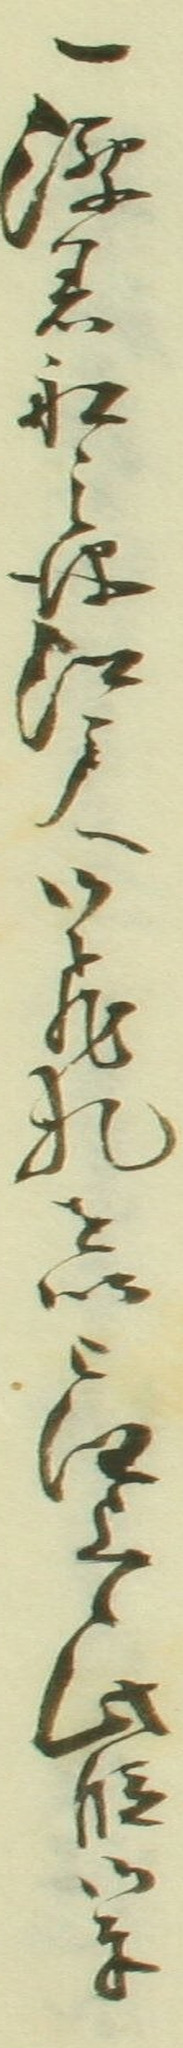一漂着船之儀江戸へ御飛札を以被任上候此段御奉

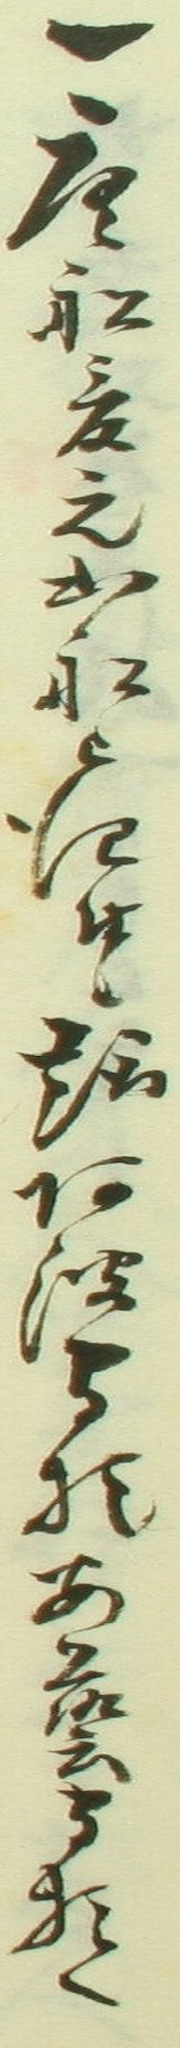一唐船爰元出船被任付候趣阿波守様安芸守様へ
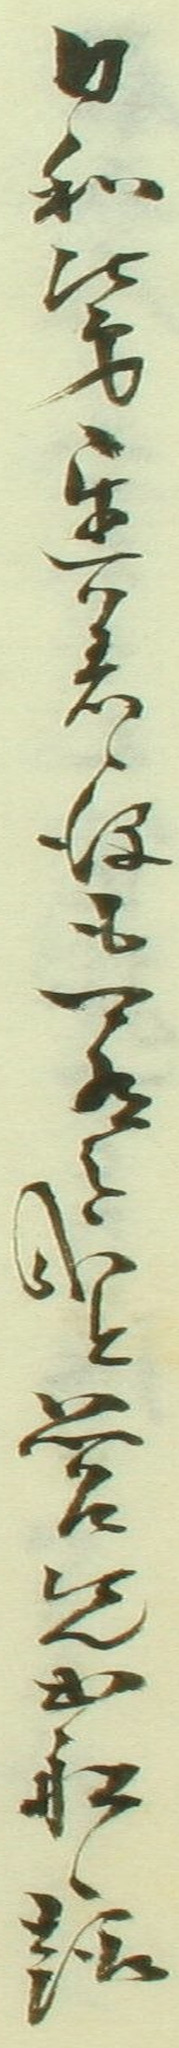日和次第遅着候儀も可有之候哉と思召先出船候趣
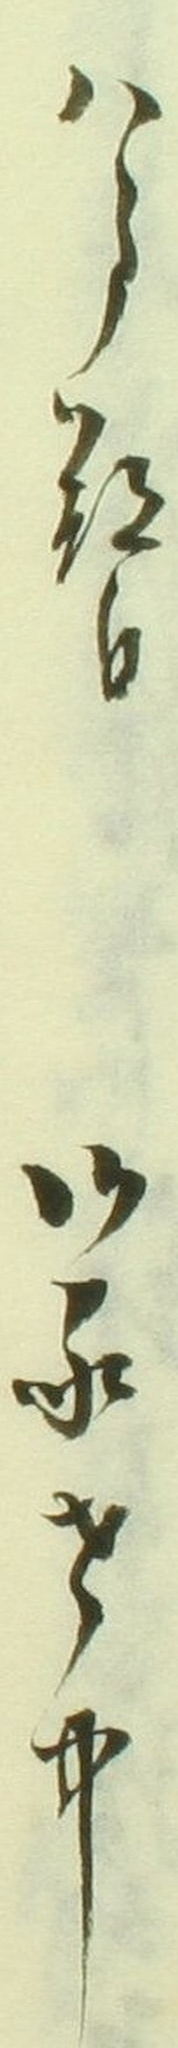八月朔日御家老中
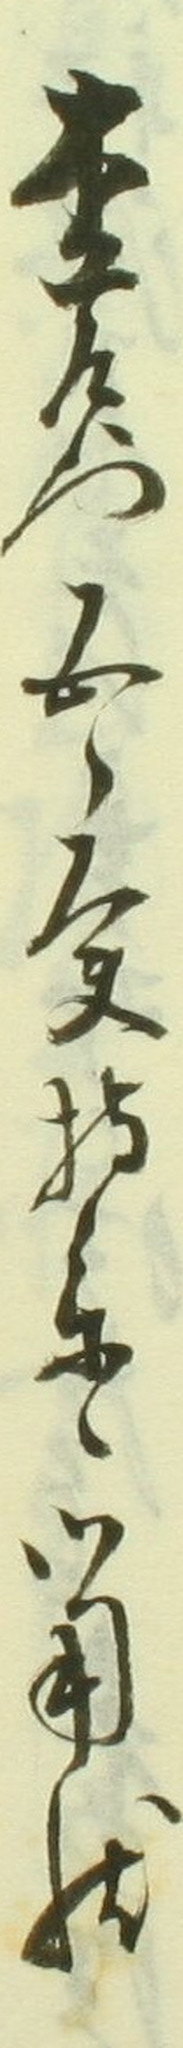杢左衛門五郎太夫指参候御用状
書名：異国船漂着記
